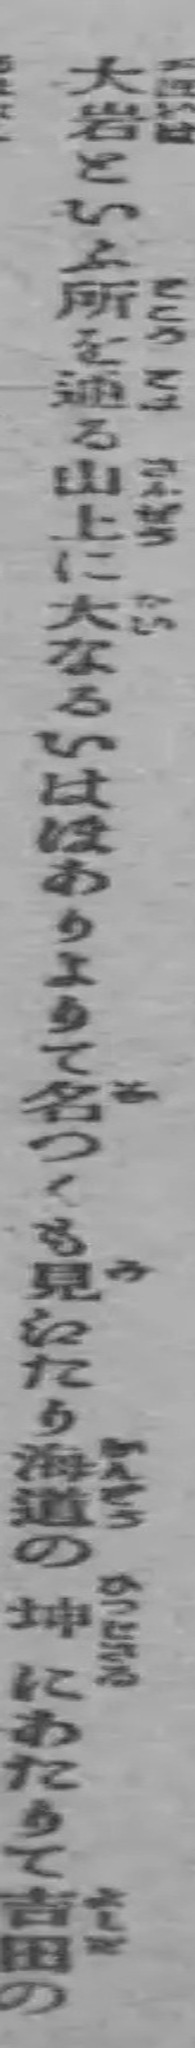大岩といふ所を通る山上に大なるいはほありよりて名つくも見えたり海道の坤にあたりて吉田の
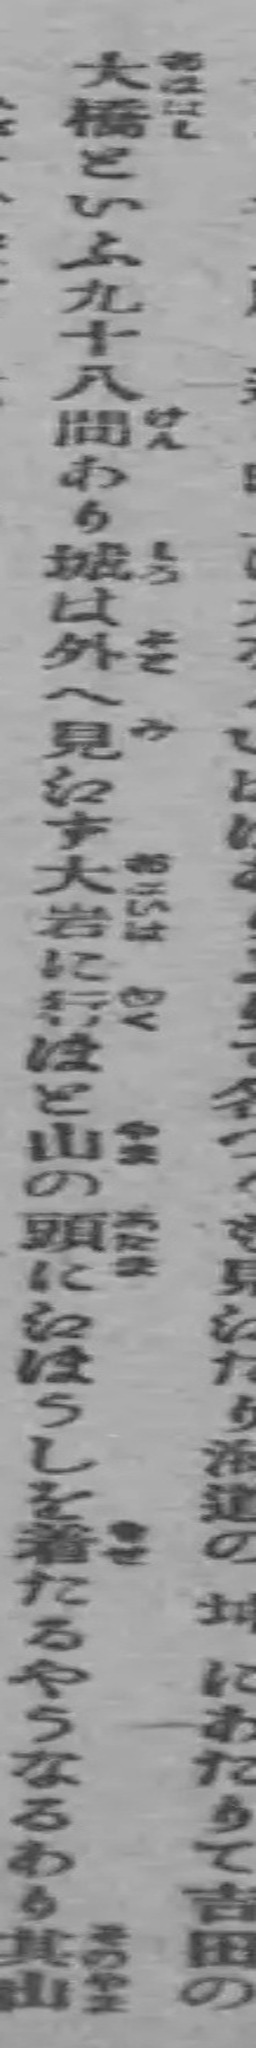大橋といふ九十八間あり城は外へ見えず大岩に行ほと山の頭にえほうしを着たるやうなるあり其山
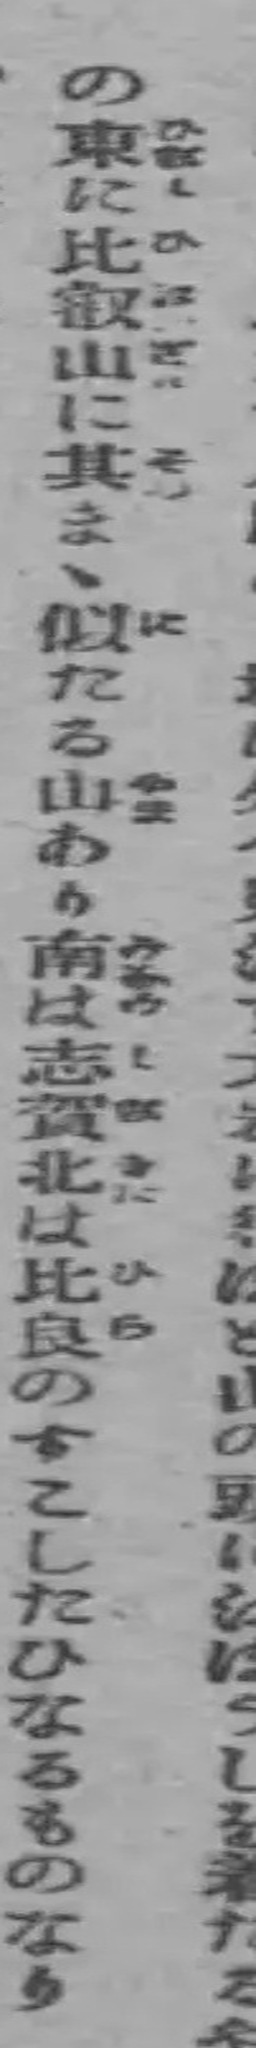の東に比叡山に其まゝ似たる山あり南は志賀北は比良のすこしたひなるものなり
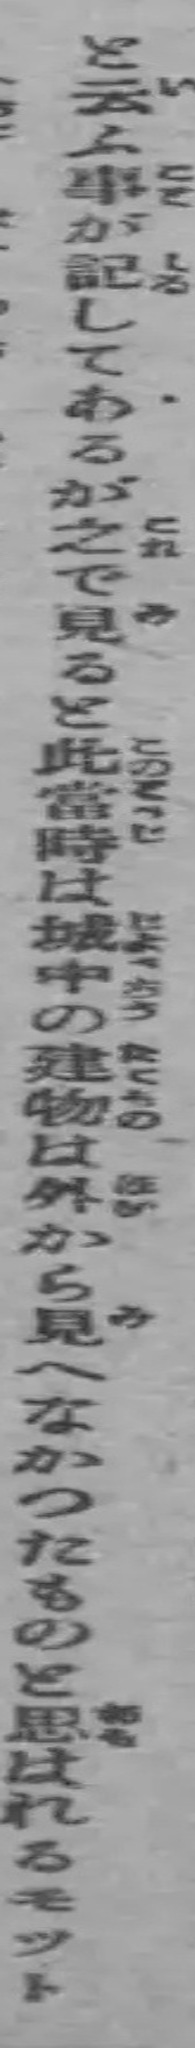城の建築と云ふ事が記してあるが之で見ると此当時は城中の建物は外から見へなかつたものと思はれるモツト
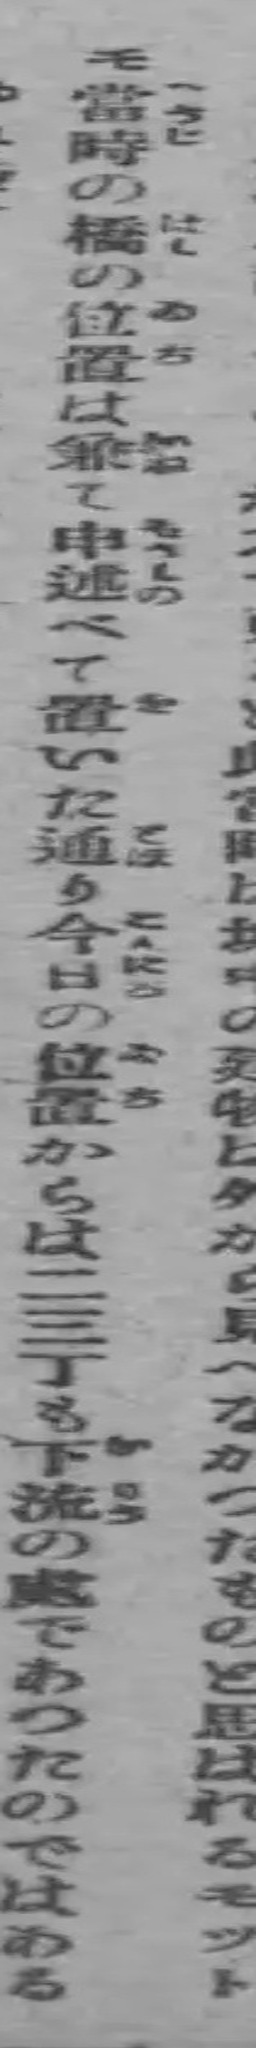モ当時の橋の位置は兼て申述べて置いた通り今日の位置からは二三丁も下流の処であつたのではある
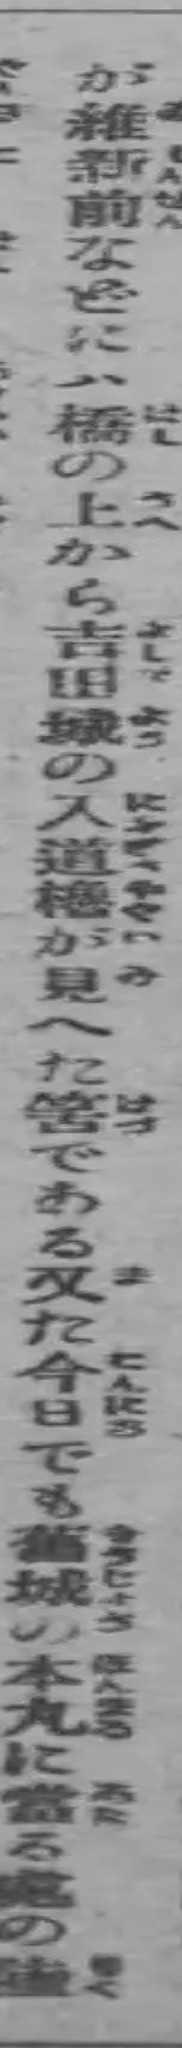が維新前などにハ橋の上から吉田城の入道櫓が見へた筈である又た今日でも旧城の本丸に当る処の陸
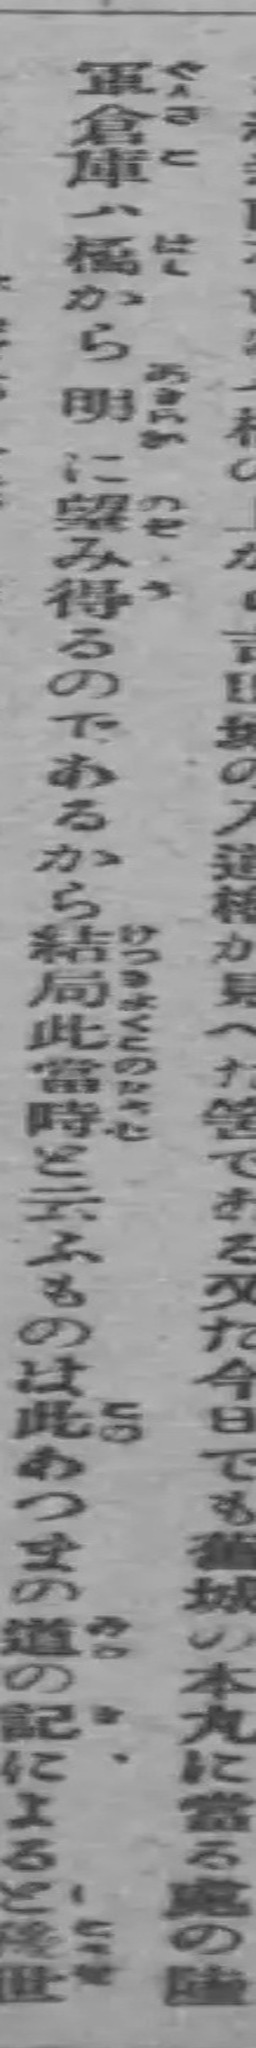軍倉庫ハ橋から明に望み得るのであるから結局此当時と云ふものは此あつまの道の記によると後世
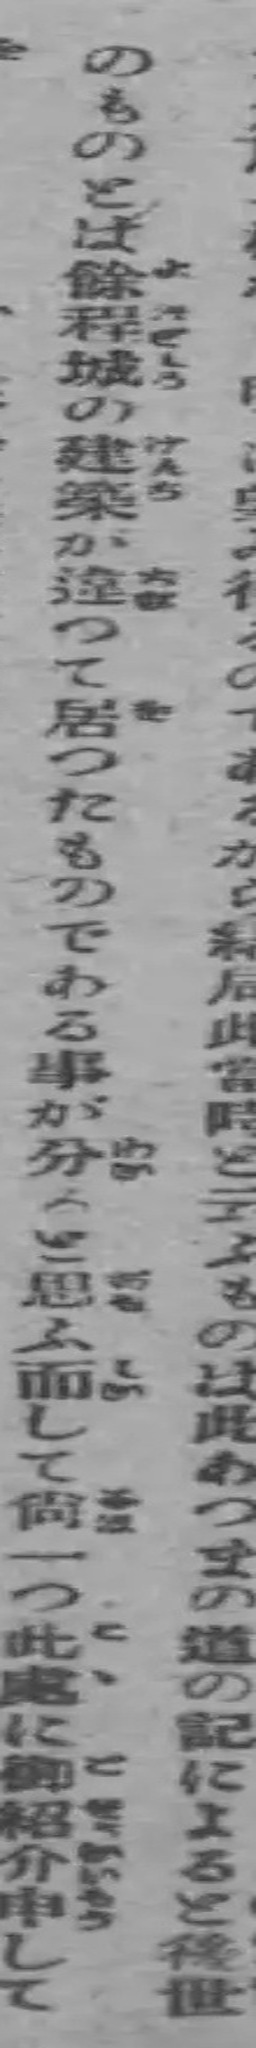のものとは余程城の建築が違つて居つたものである事が分ると思ふ而して尚一つ此処に御紹介申して
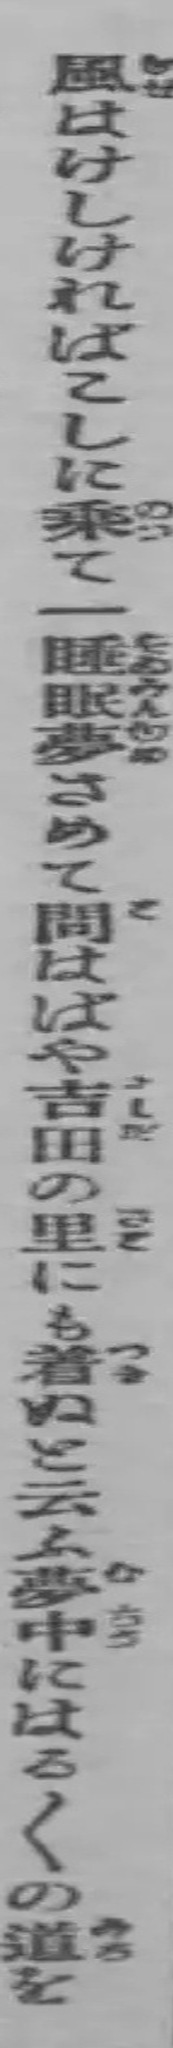風はけしければこしに乗て一睡眠夢さめて問はばや吉田の里にも着ぬと云ふ夢中にはる〳〵の道を
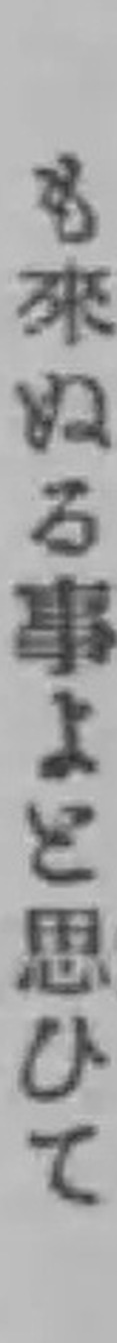も来ぬる事よと思ひて
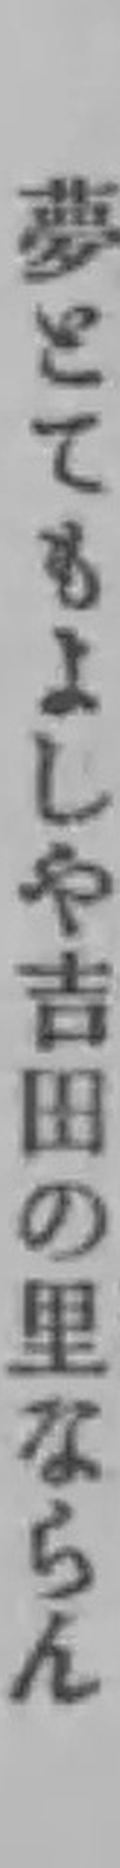夢とてもよしや吉田の里ならん
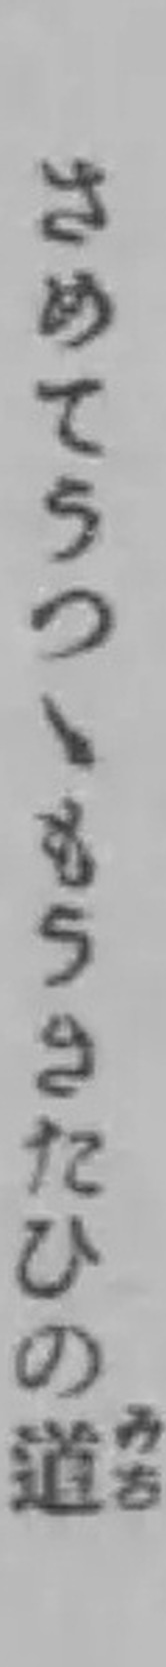さめてうつゝもうきたひの道
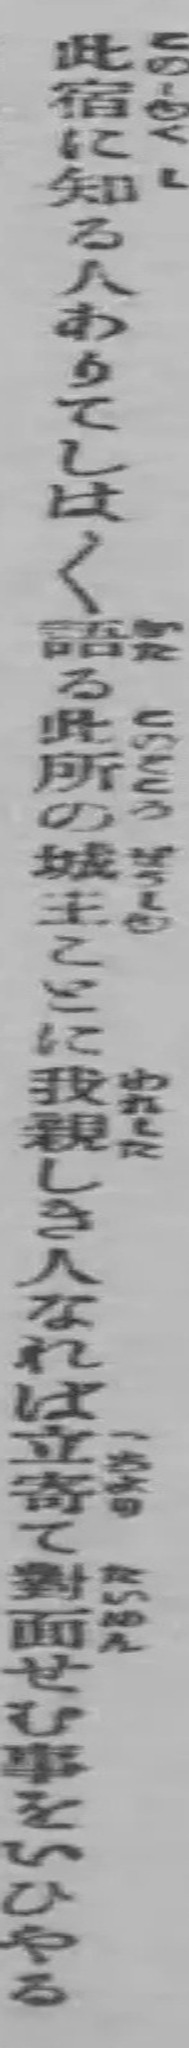此宿に知る人ありてしは〳〵語る此所の城主ことに我親しき人なれば立寄て対面せむ事をいひやる
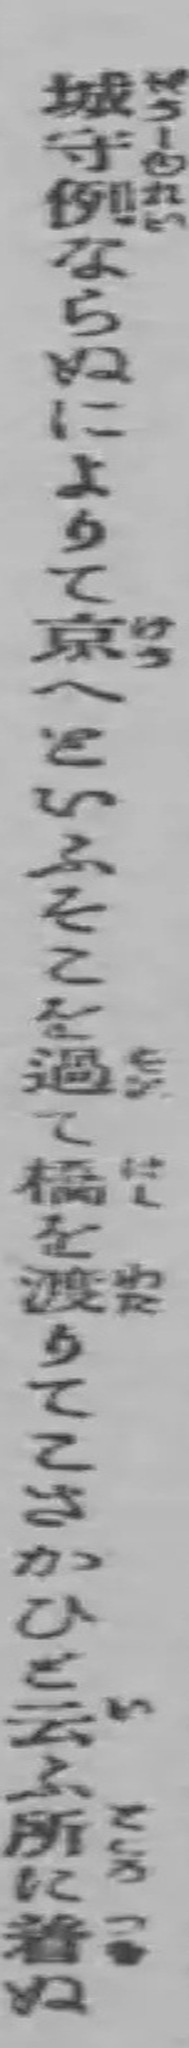城守例ならぬによりて京へといふそこを過て橋を渡りてこさかひと云ふ所に着ぬ
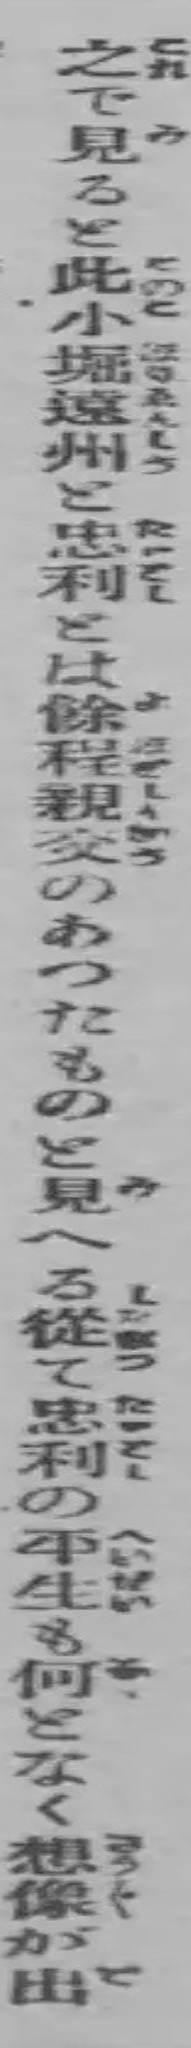之で見ると此小堀遠州と忠利とは余程親交のあつたものと見へる従て忠利の平生も何となく想像が出
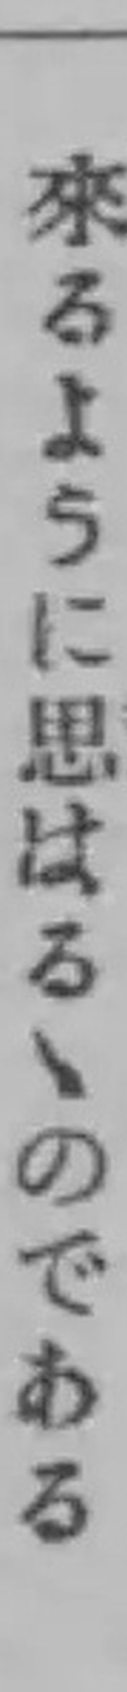来るように思はるゝのである
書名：豊橋市史談
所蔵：国立国会図書館 National Diet Library, JAPAN
